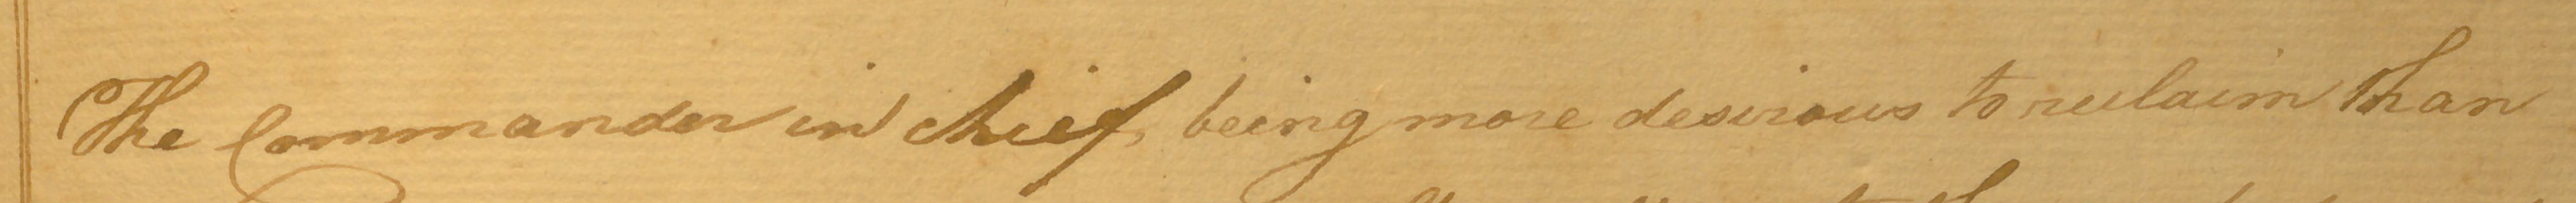The Commander in chief being more desirous to reclaim than
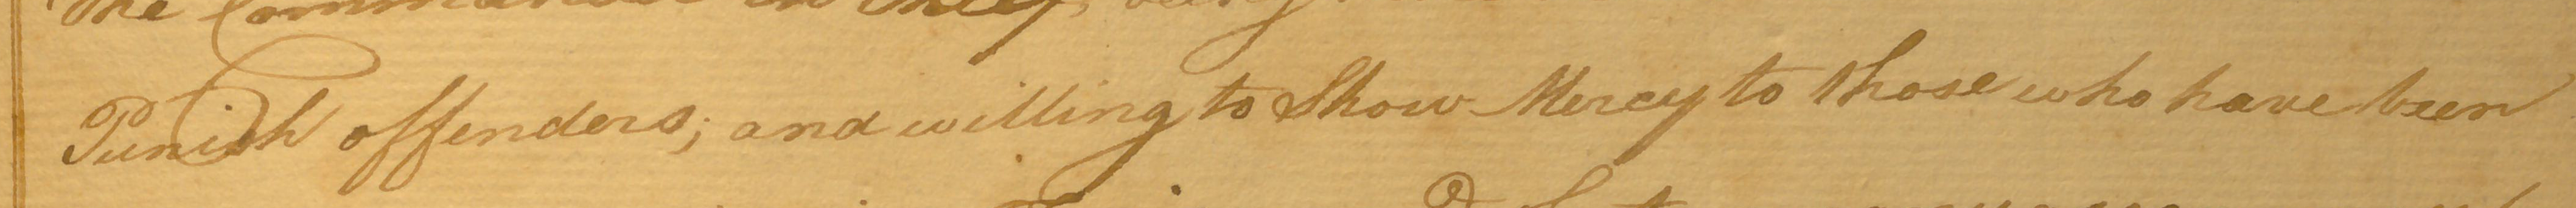Punish offenders; and willing to Show Mercy to those who have been
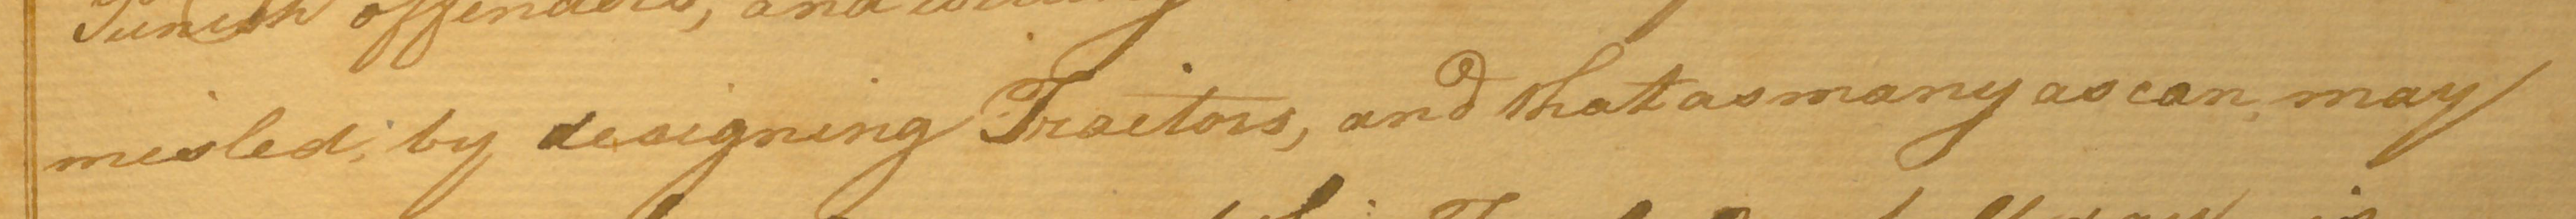misled by designing Traitors, and that as many a can may
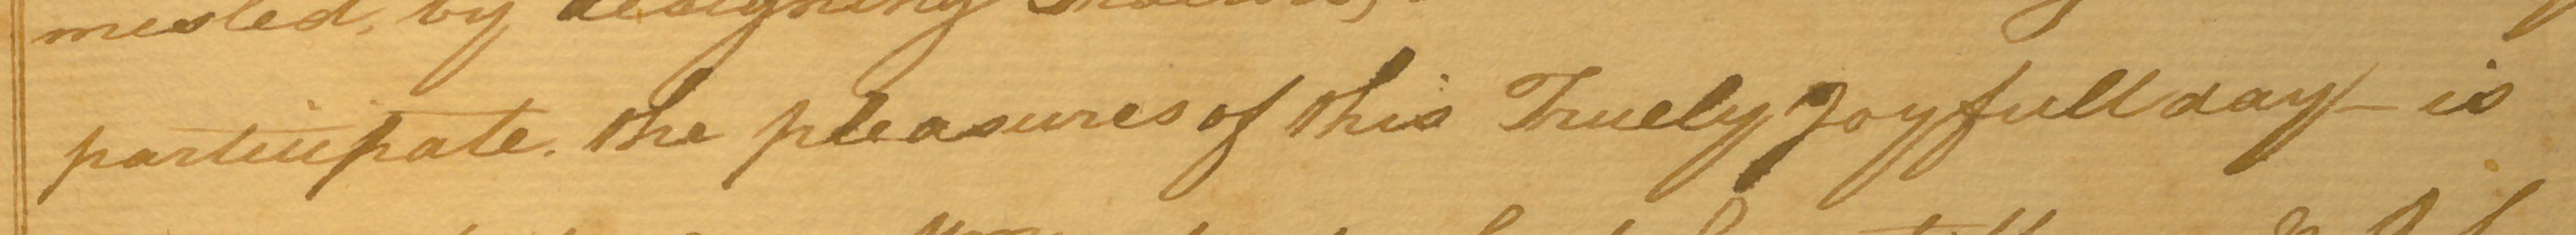participate the pleasures of this Truely joyfull day- is
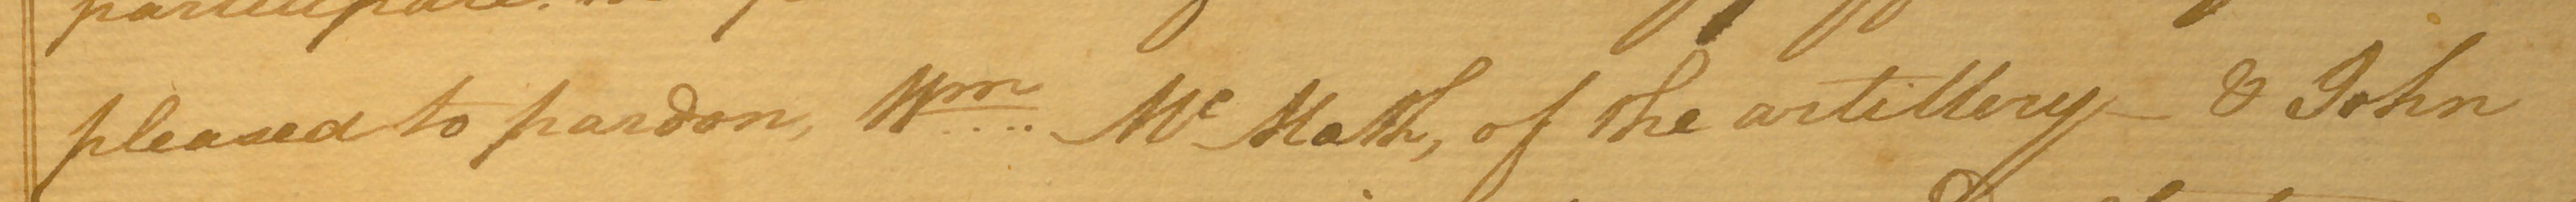pleased to pardon, W^m. M^cMath of the artillery & John
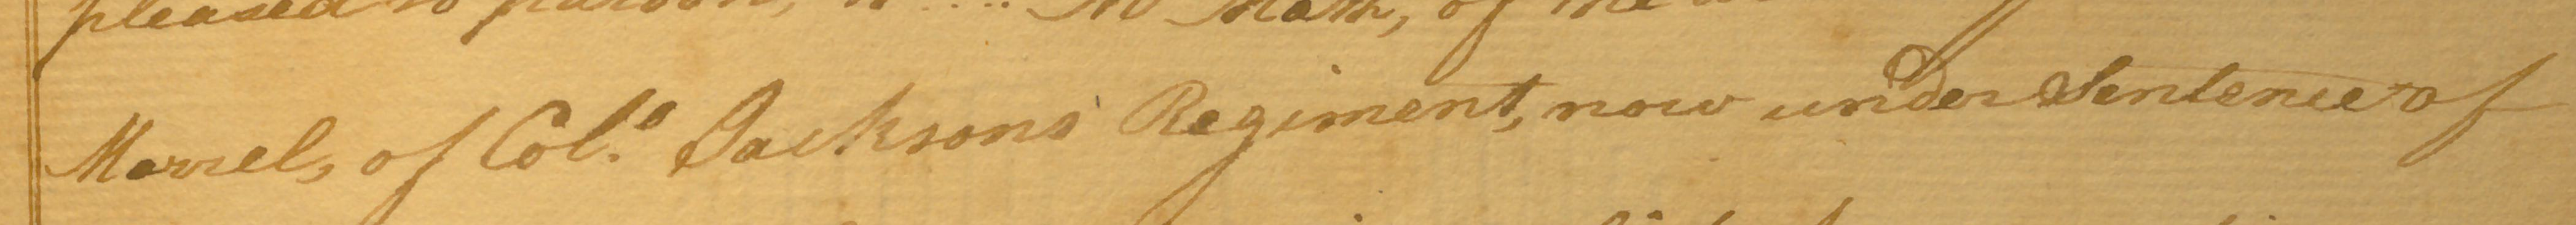Morrel, of Col^o. Jackson's Regiment, now under sentence of
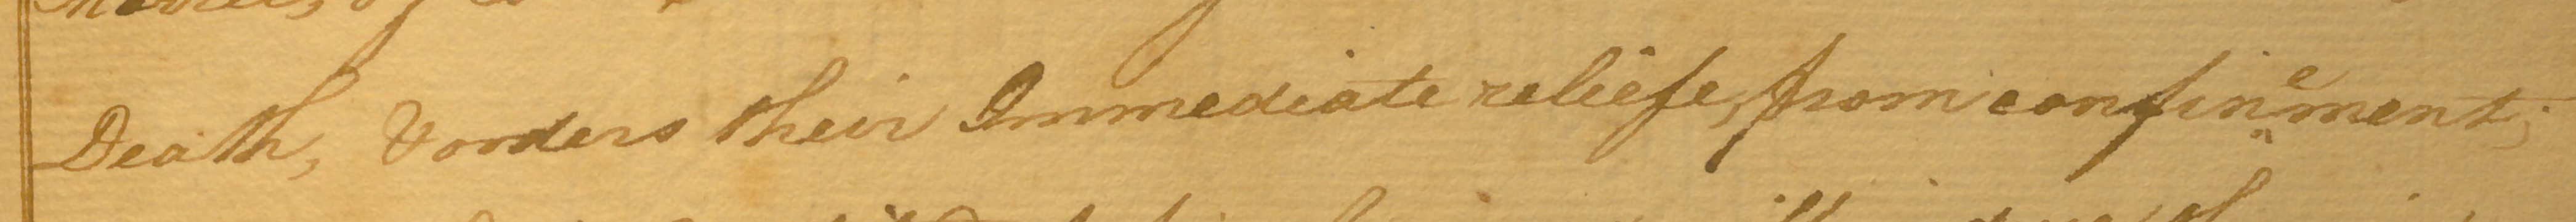Death, & orders their Immediate reliefe from confin^ement,
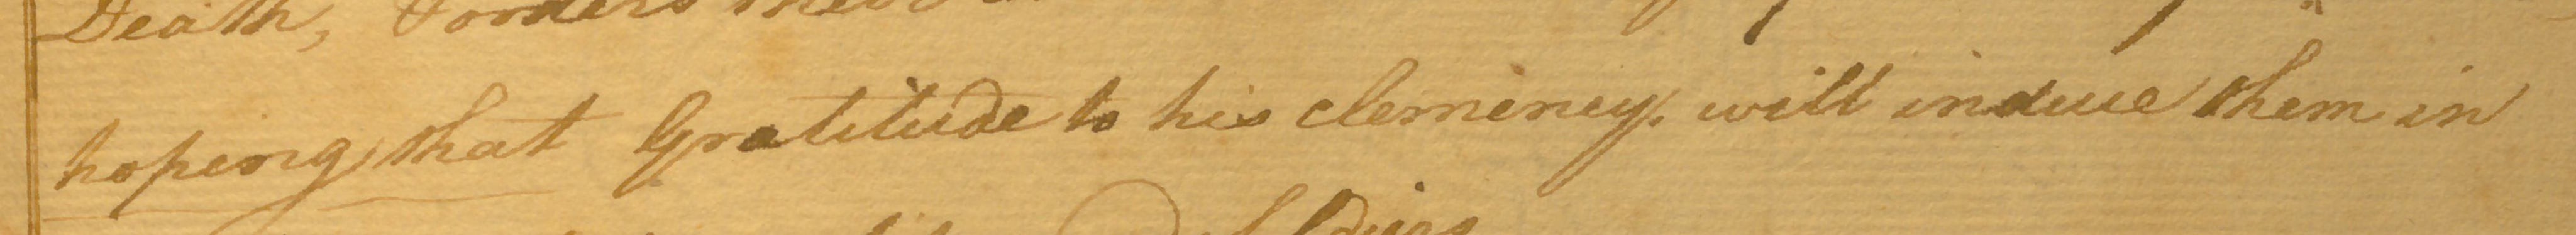hoping that Gratitude to his clemency will induce them in
